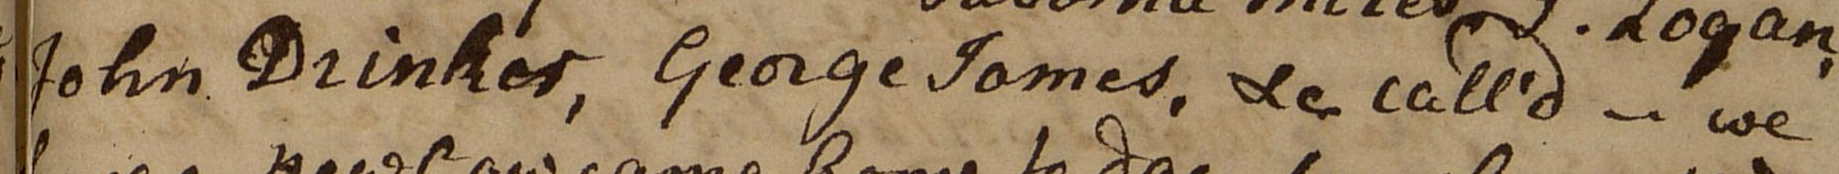John Drinker, George James, &c call'd- we
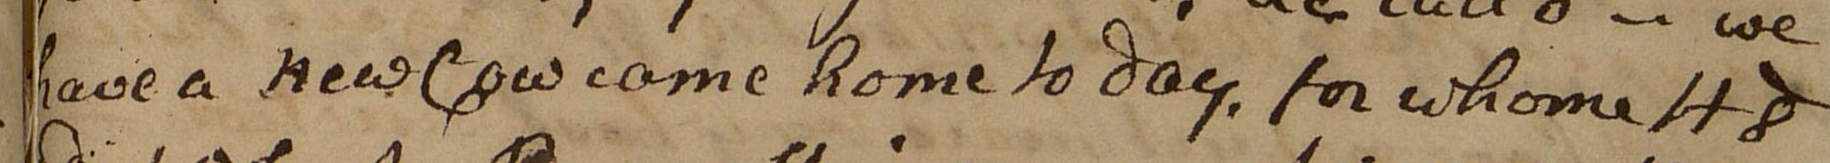have a new Cow come home to day, for whome [H8]
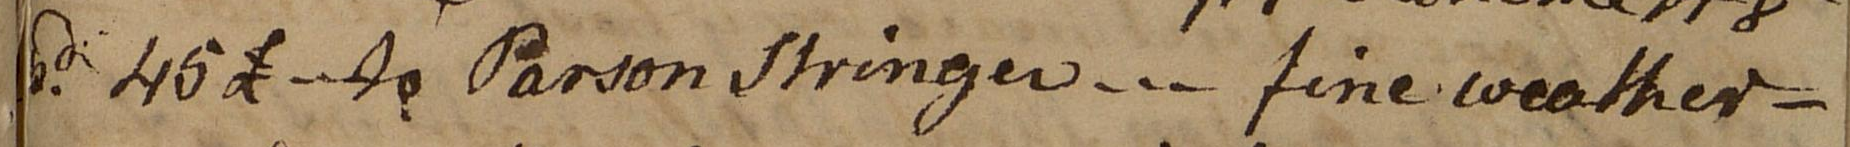5.^d 45£- to Parson Stringer-- fine weather-
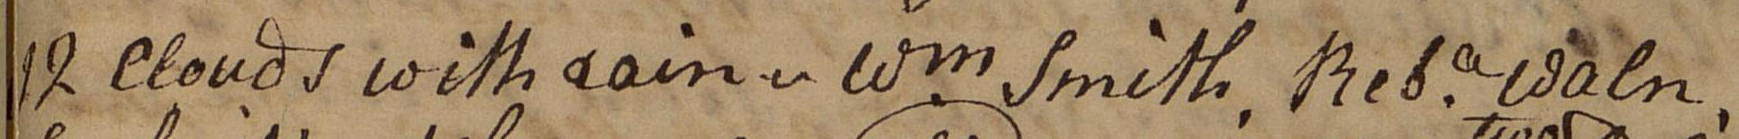I2 Clouds with rain- W^m Smith Reb^a Waln,
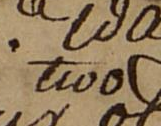two
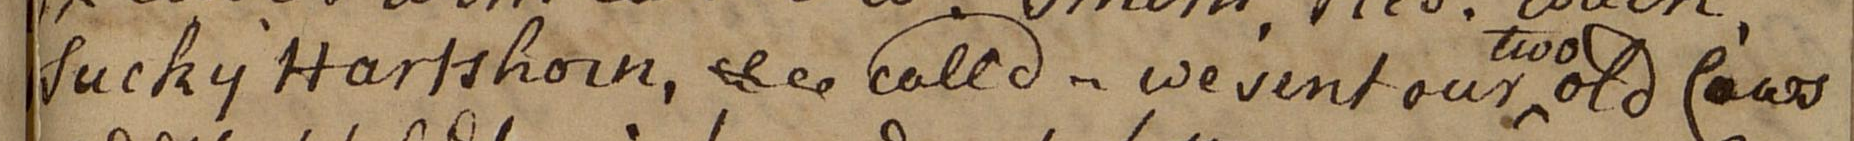Sucky Hartshorn, &c call'd- we sent our ^ old Cows
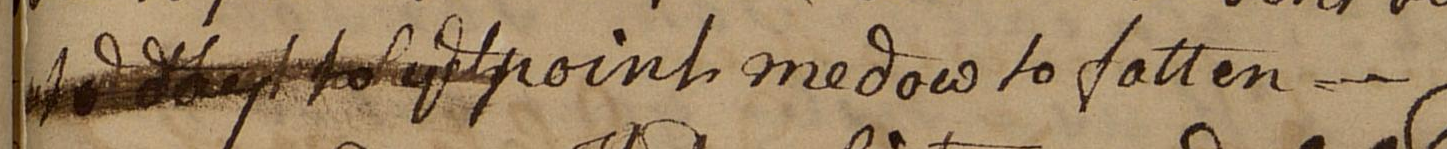to day to y^e point medow to fatten-
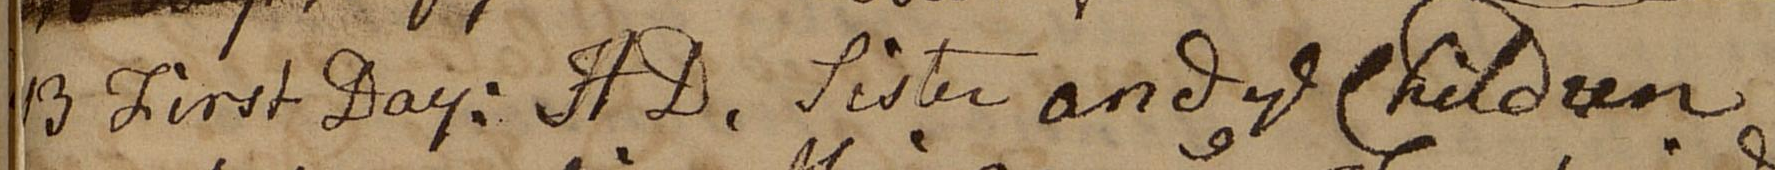13 First Day: HD. Sister and y^e Children
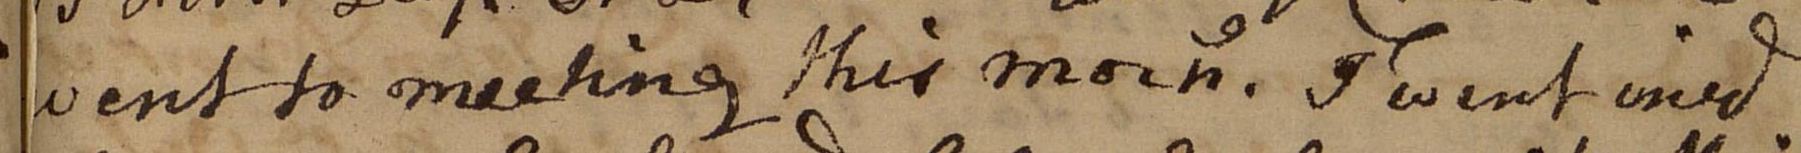went to meeting this morn^g. I went in y^e
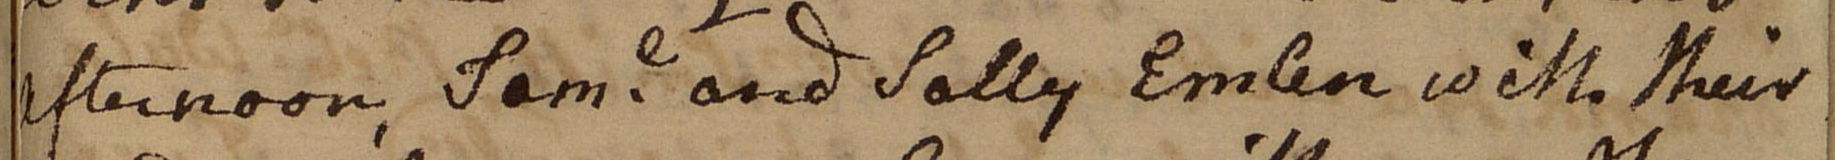Afternoon, Sam^l. and Sally Emlen with their
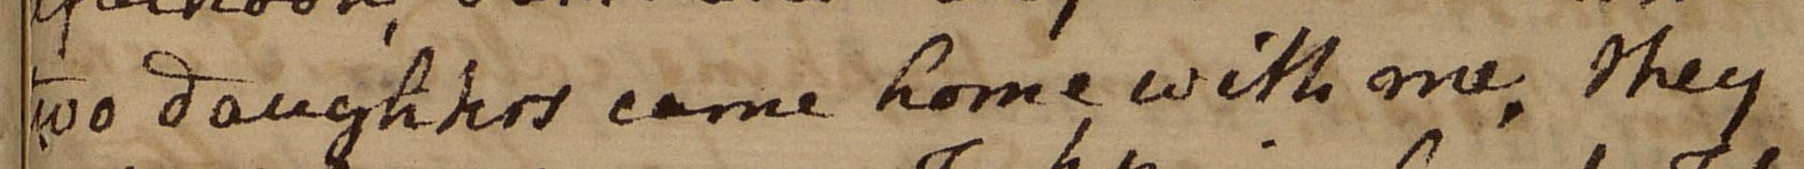two daughters came home with me, they
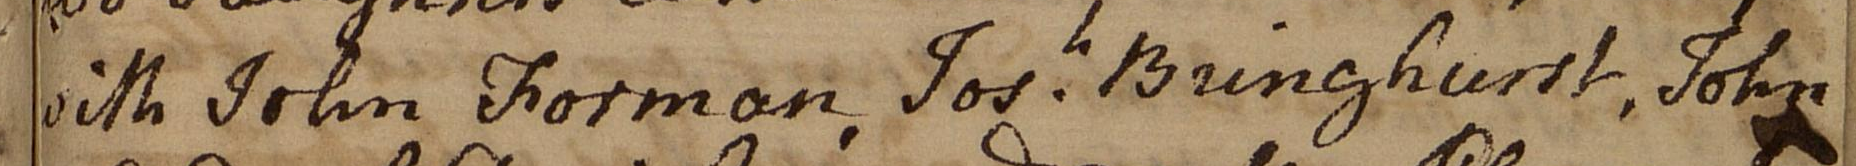with John Forman, Jos^h. Bringhurst, John
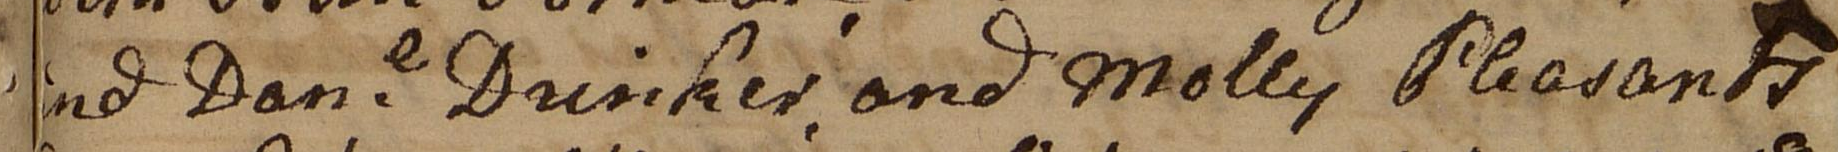nd Dan^l Drinker and Molly Pleasants
